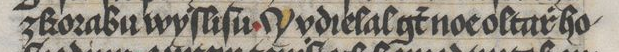zkorabu wyẛli ſu.Y vdielal ḡt noe oltaṙ ho¬
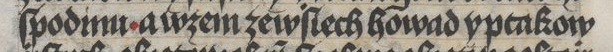ſpodinu.a wzem zewẛiech howad yptakow
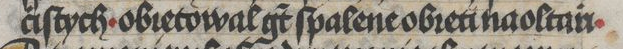ċiſtych.obietowal ḡt ſpalene obieti naoltaṙi.
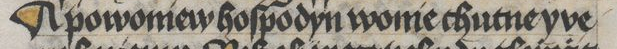A powoniew hoſpodyn wonie chutne y ve¬
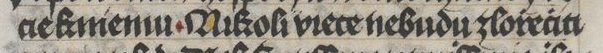cie kniemu.Nikoli víece nebudu zloṙeċíti
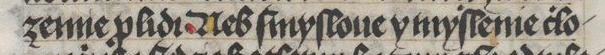zemie ꝓlidi.Neb ſmyſloue y myẛlenie ċlo¬
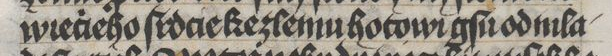wieċieho ſrdcie ke zlemu hotowi gſu od mla¬
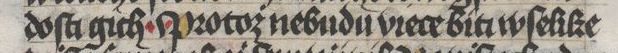doſti gich.Protoż nebudij víece bíti wſelike
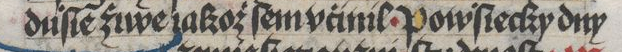duẛie żiwe iakoż ſem vċinil.Powẛiecky dny
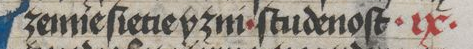zemie ſietie y zní.ſtudenoſt. ix.
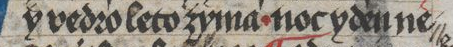y vedro leto zyma.noc ydeſ ne¬
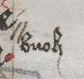buoh
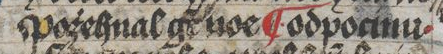Pożehnal ḡt noe sodpocíí.
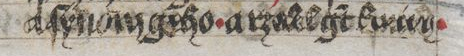a ſyními geho.a rzibl ḡt boiwvl.
